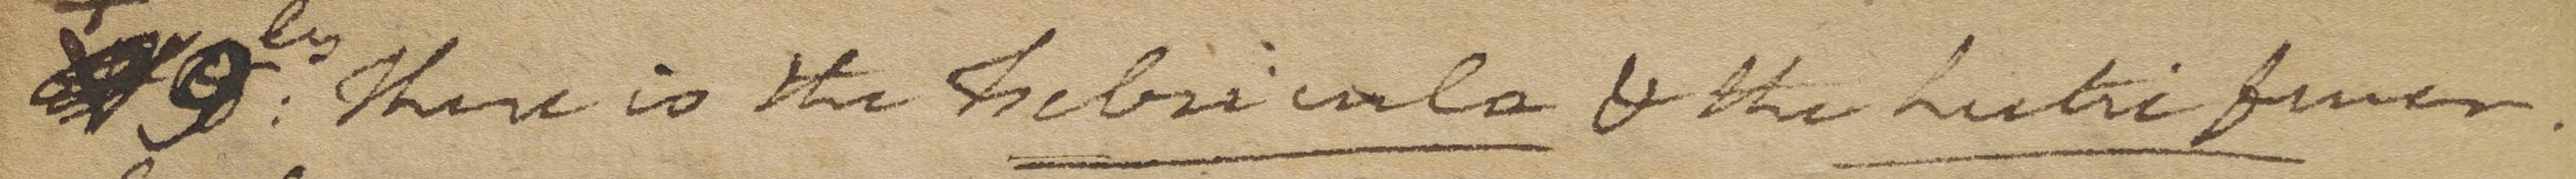9^ly: There is the Febricals & the hectic fever
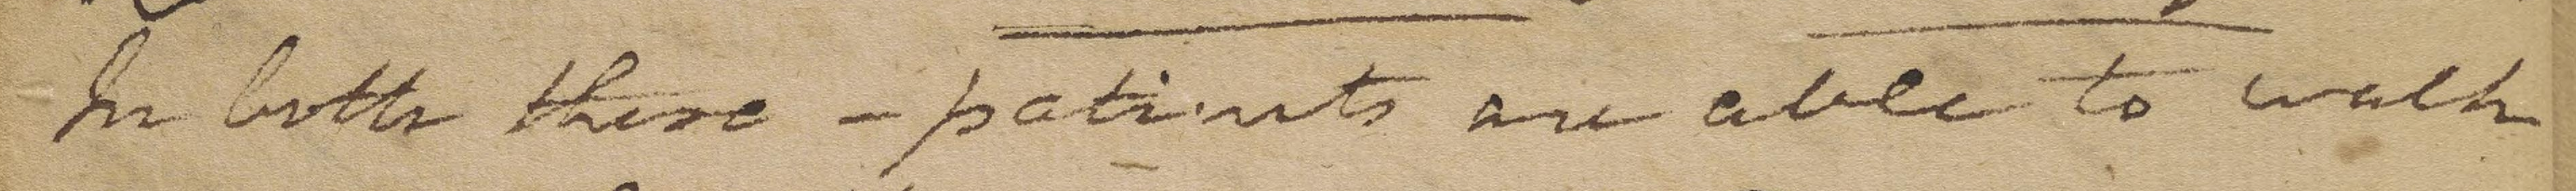In both there, patients are able to walk
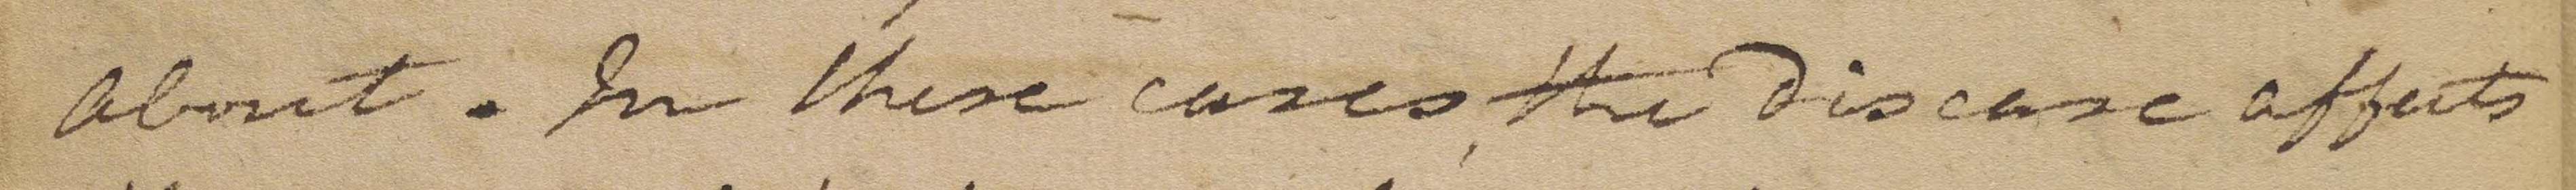about. In these cases the disease affects
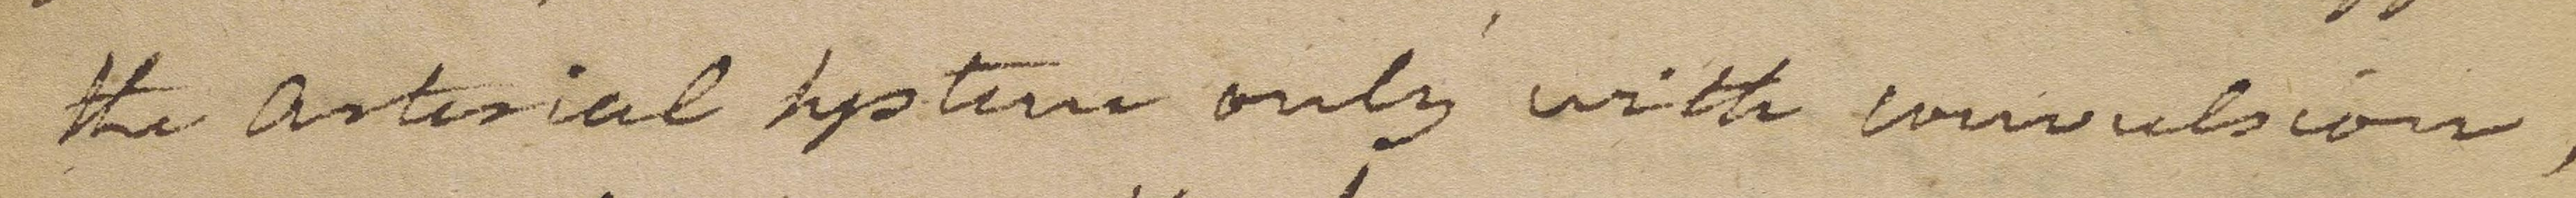the arterial system only with convulsions
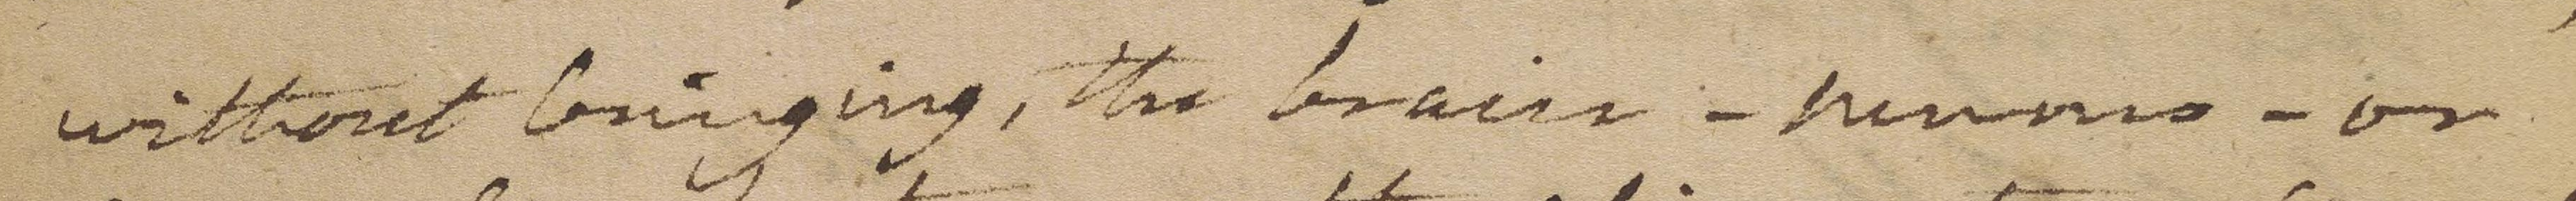without bringing, the brain- nerves- or
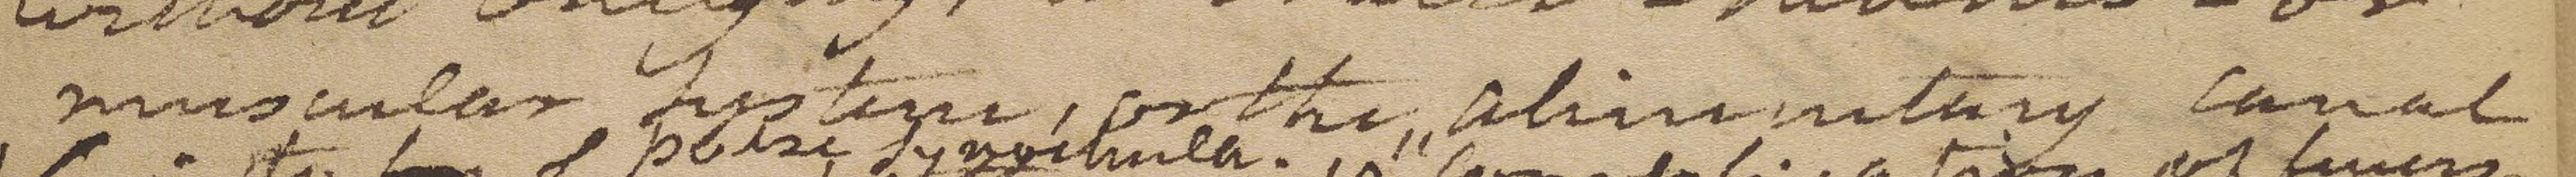muscular system, or the alimentary canal
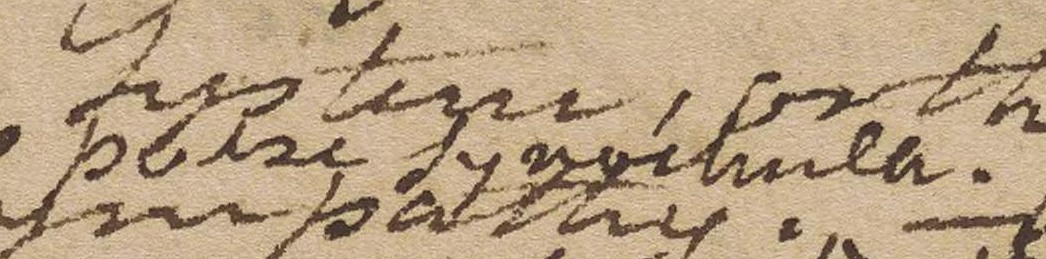pulse Synomea
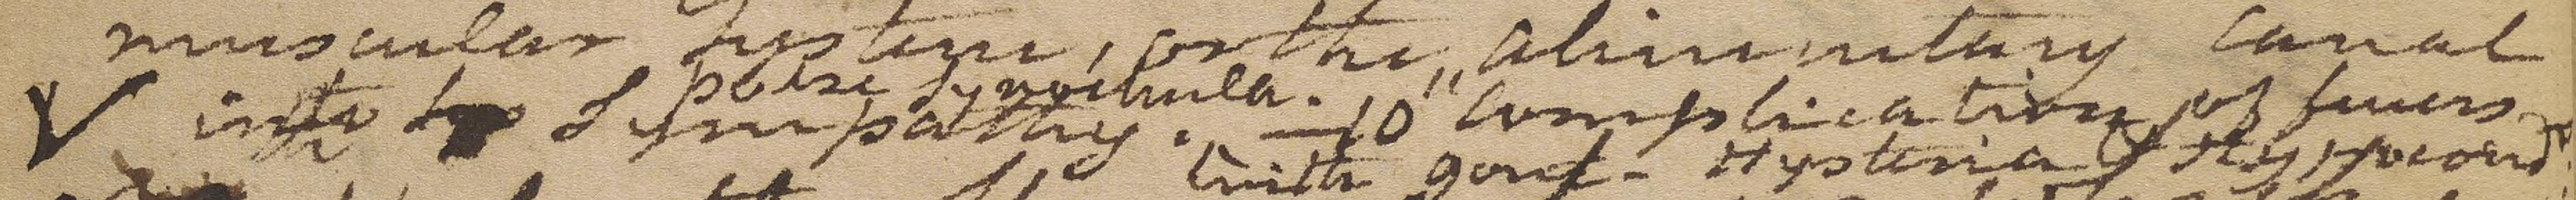V into Sympathy. 10 Complications of fevers
